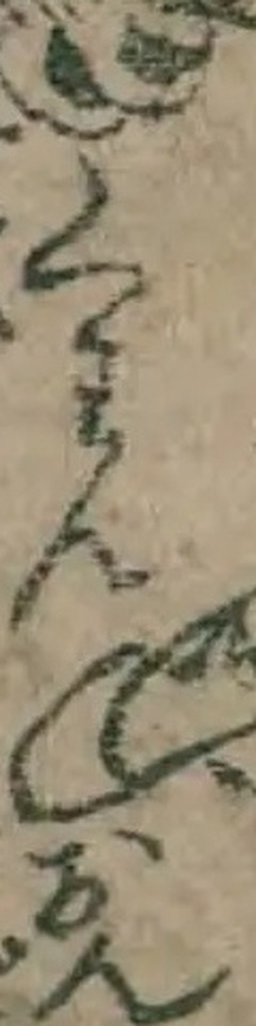くわんおん
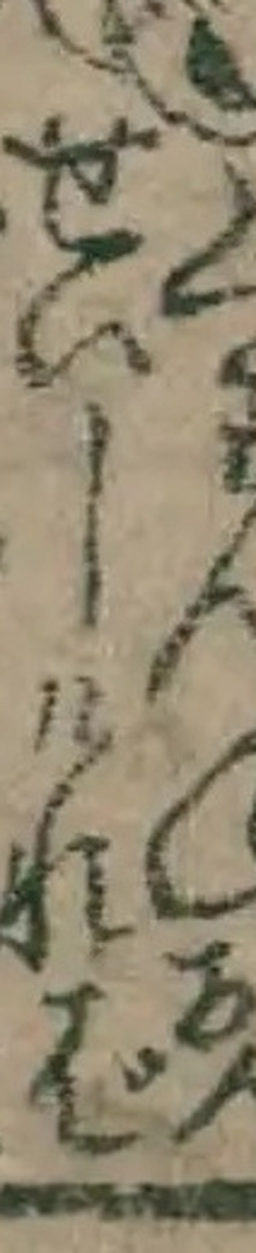せいしければ
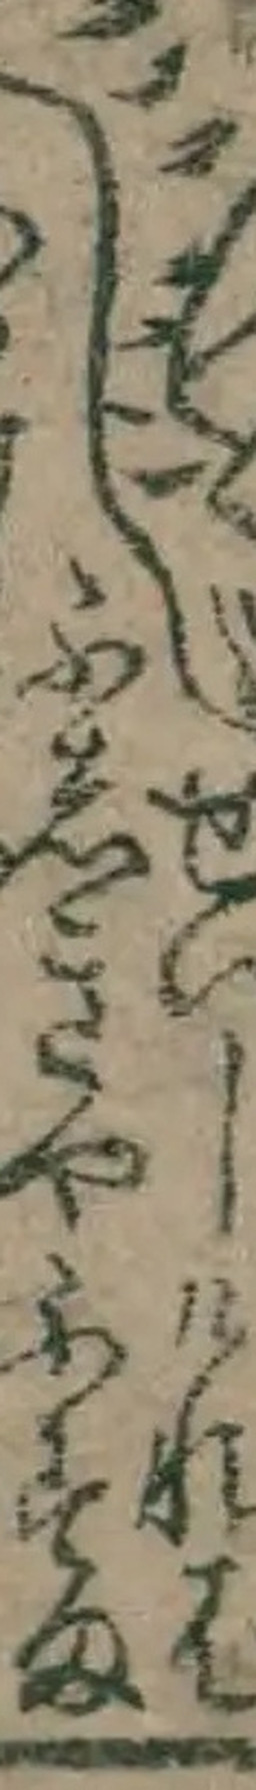ふしきやふすま
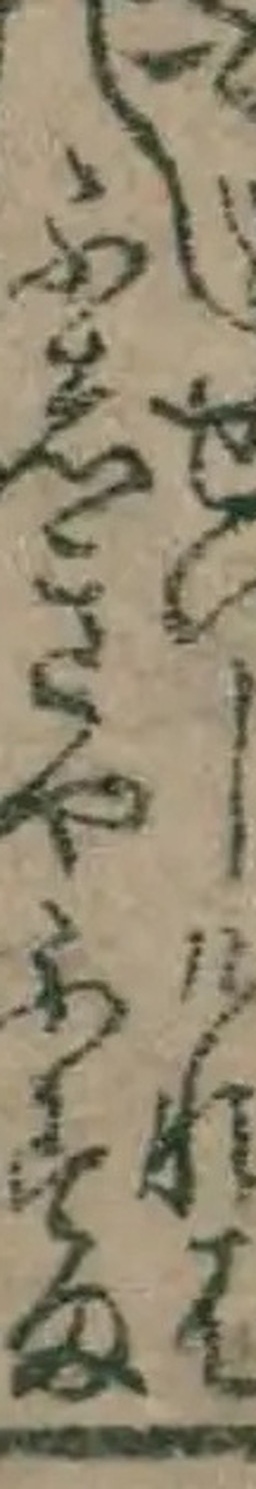ふしきやふすま
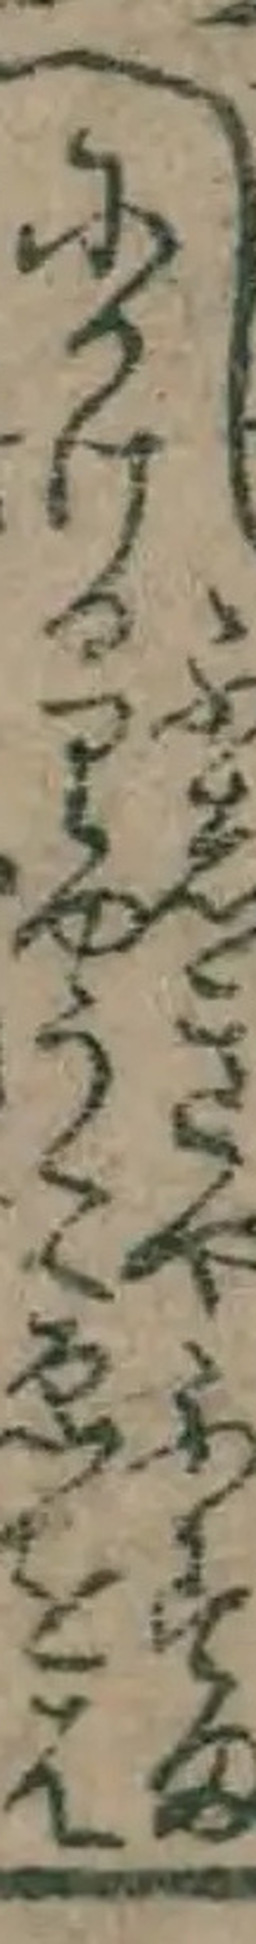にかけるりやうこゑをは
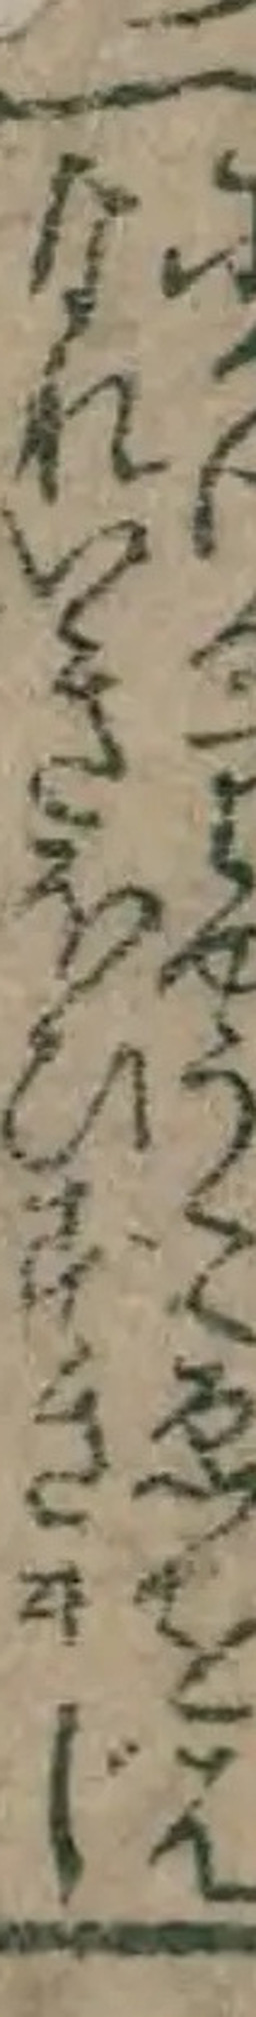なれいきほひすさまじ
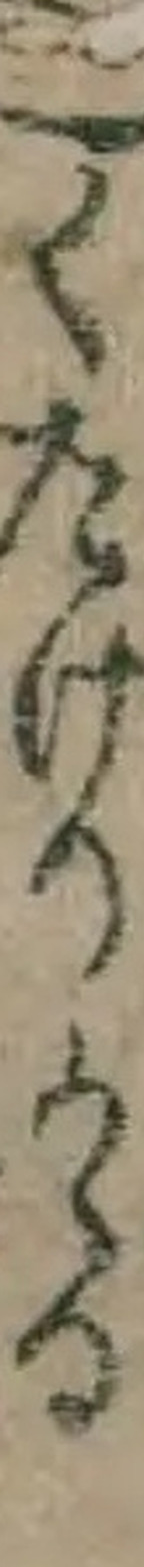くたけりかゝる
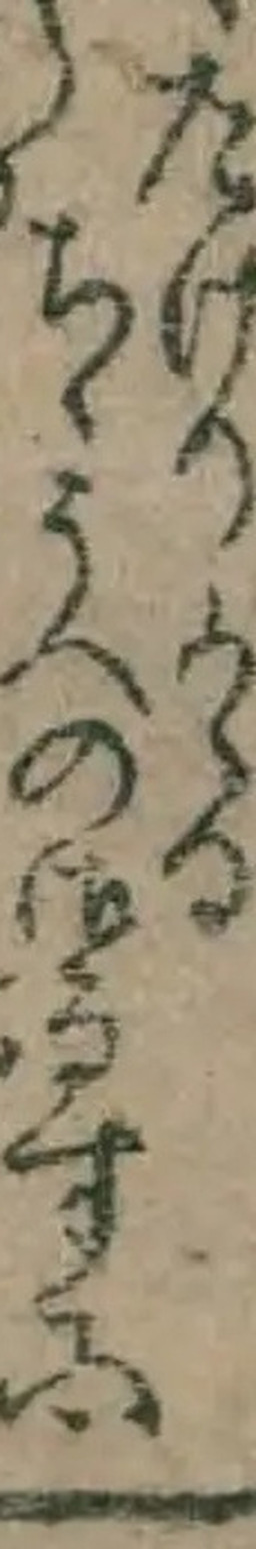ちゝうへの御るすに
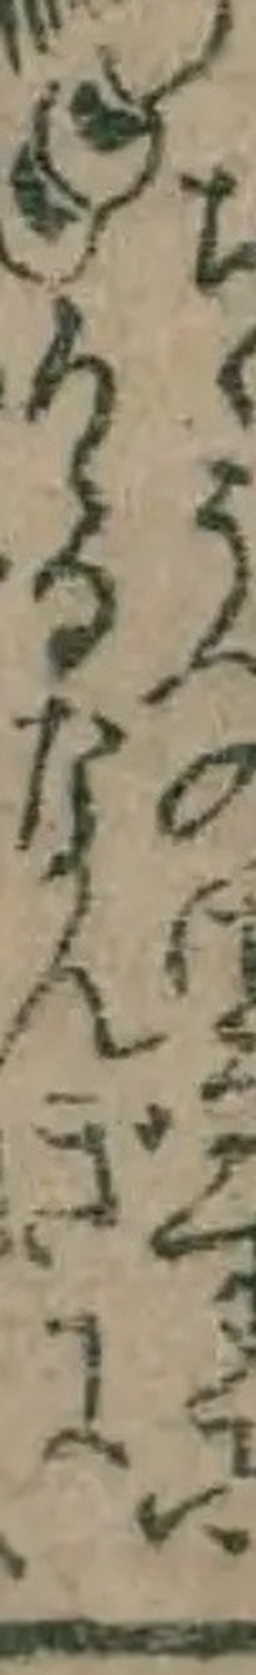かゝるなんぎに
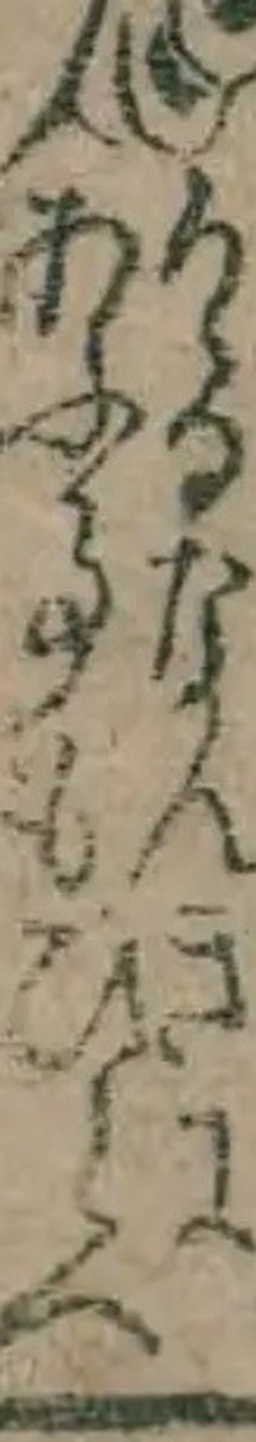あふ事もひとへ
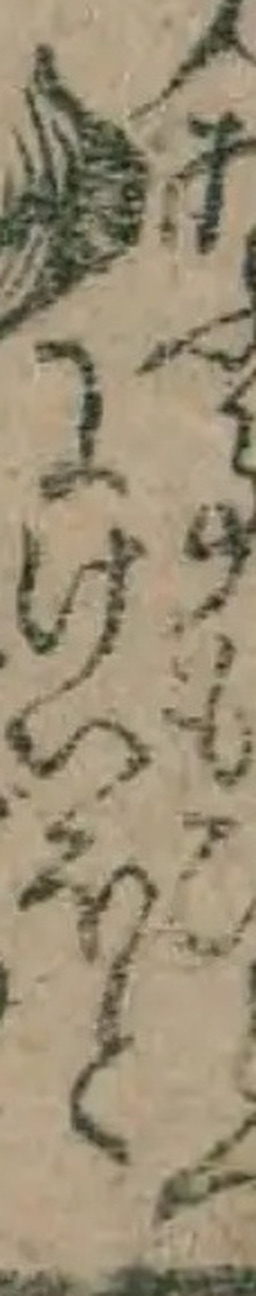にけいほと
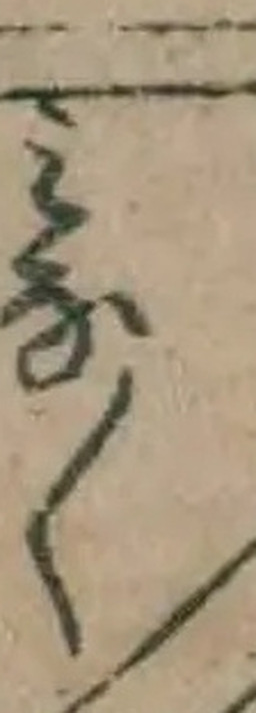みな〳〵
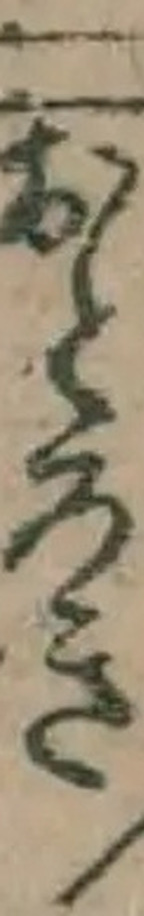おとろき
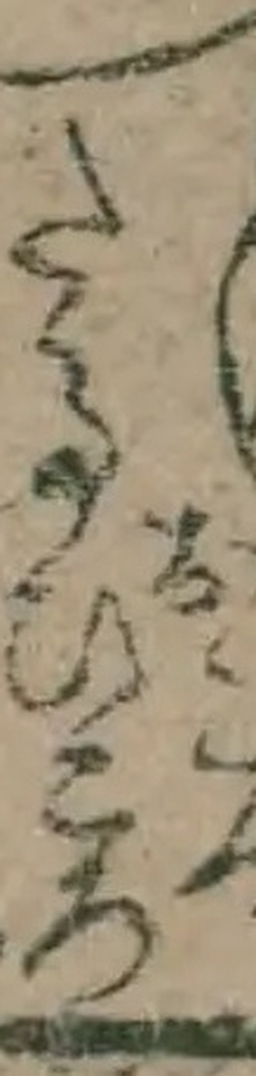た事ひころ
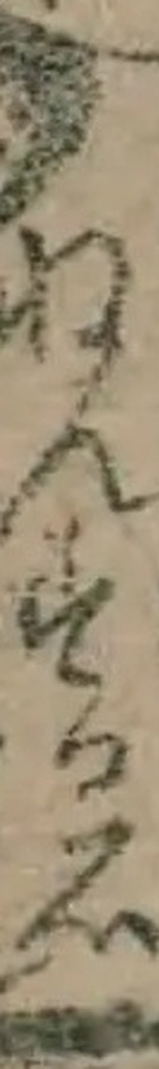ねんする石
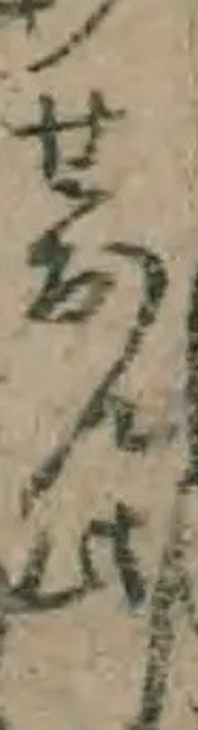せおん此
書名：団十郎蓬芥伝
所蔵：国立国会図書館 National Diet Library, JAPAN
